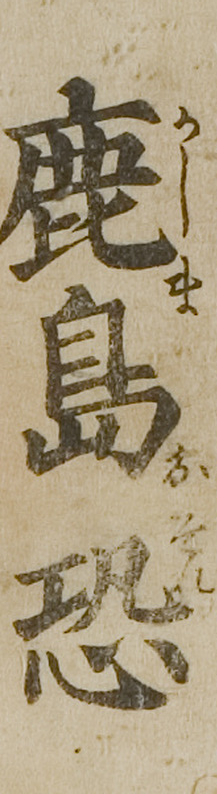鹿島恐
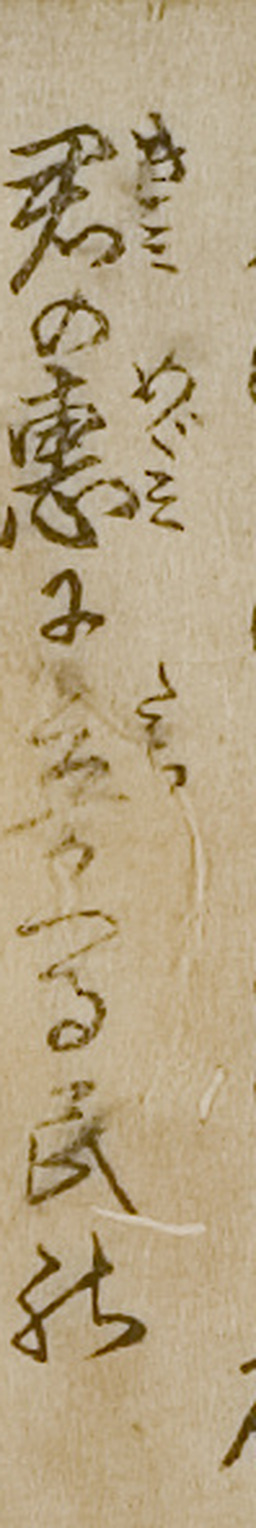君の恵に立かへる民の
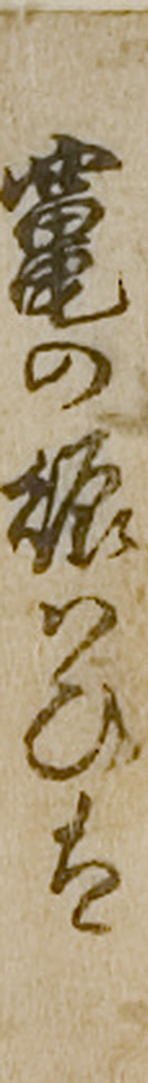竈の賑はひは
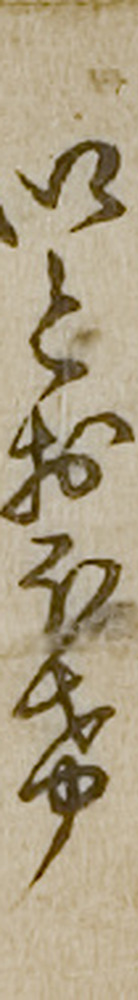いとおほけ
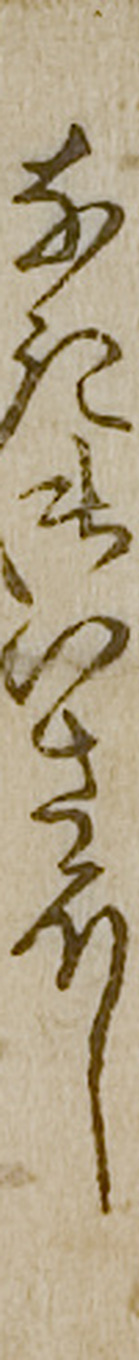なき御いさほし
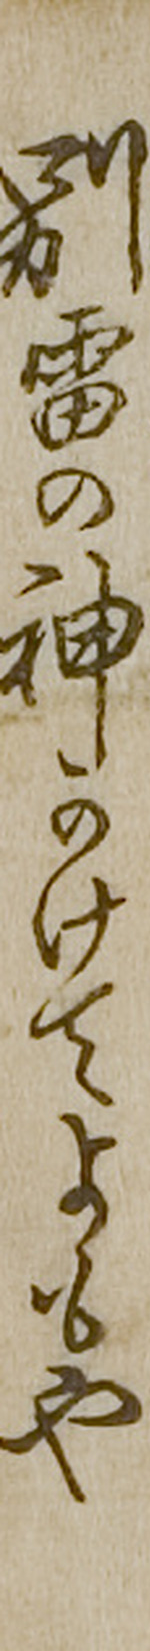別雷の神かけてよもや
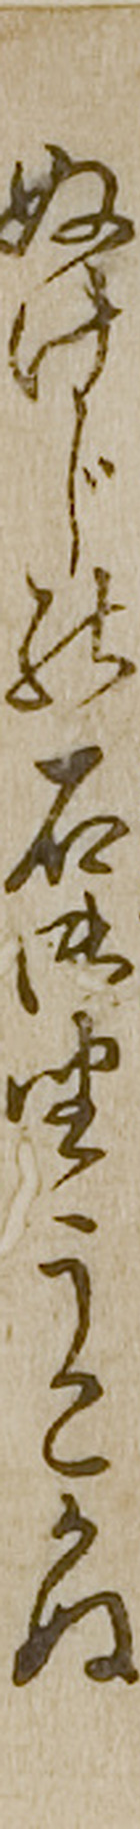ぬけじの石御坐うこかぬ
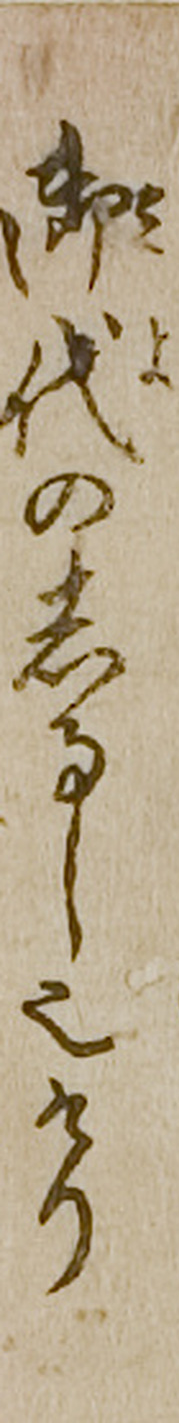御代のしるし也けり
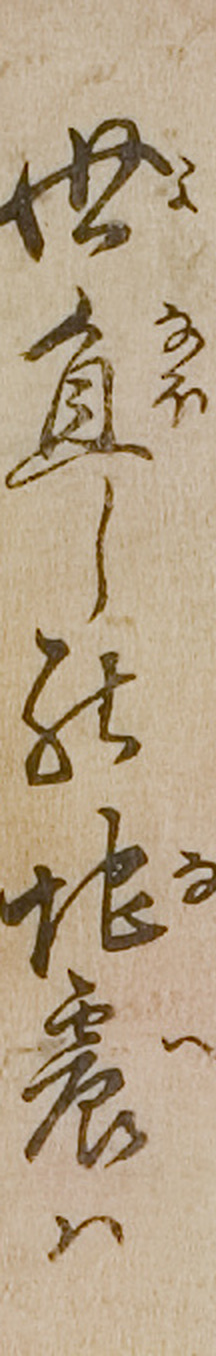世直しの地震は
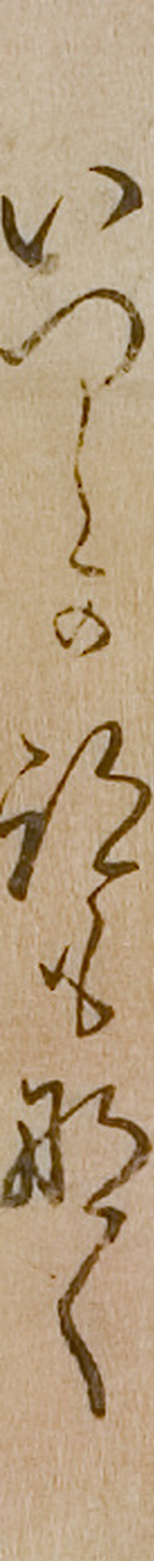いつしか跡もなく
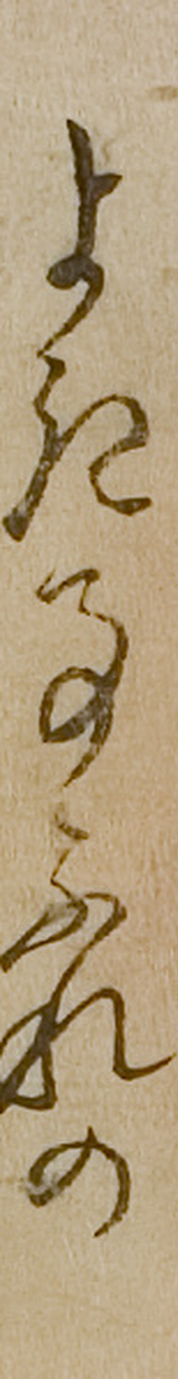よき事ふれの
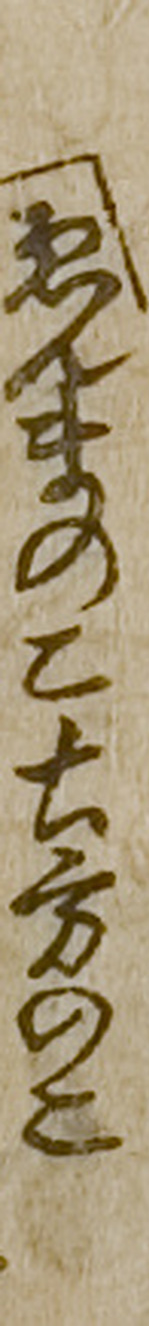乁ゑんまのこ土方のこ
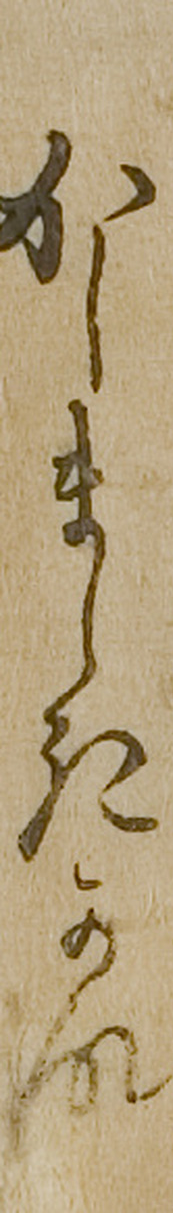かしましきかな
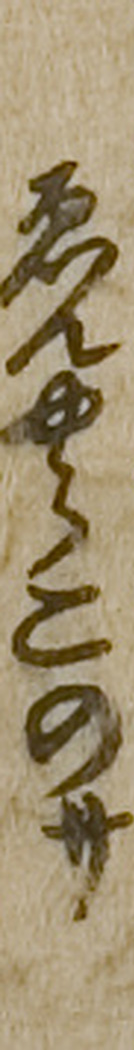ゑんやらこのサ
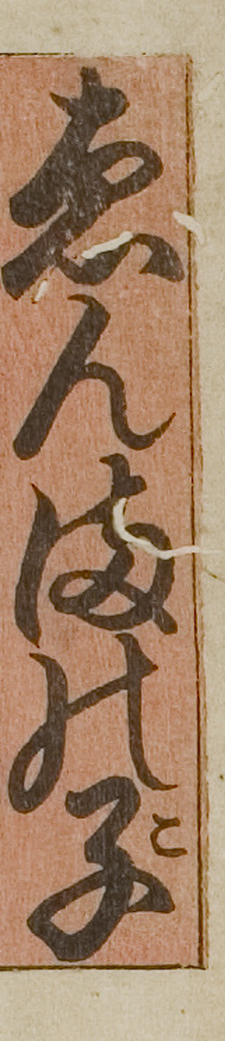ゑんまの子
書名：鹿島恐
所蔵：東京大学総合図書館 General Library in the University of Tokyo, JAPAN
